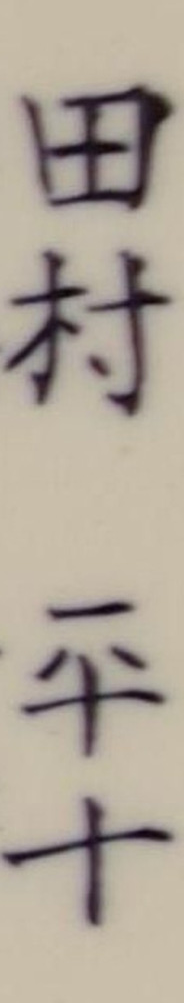田村平十
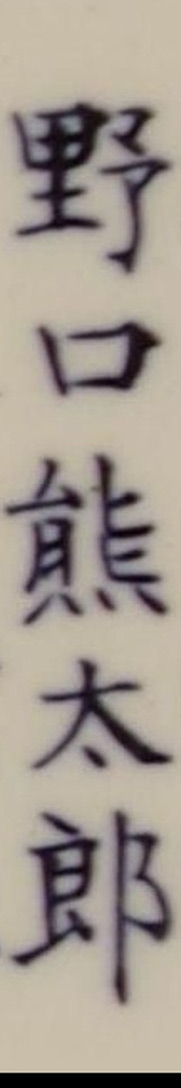野口熊太郎
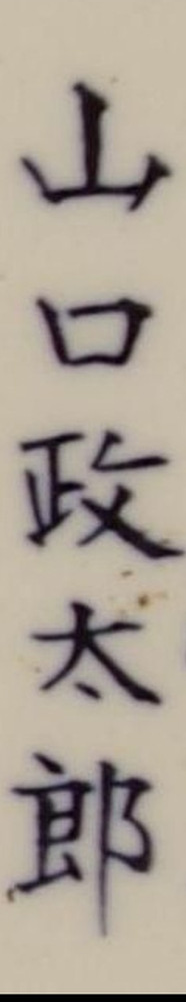山口政太郎
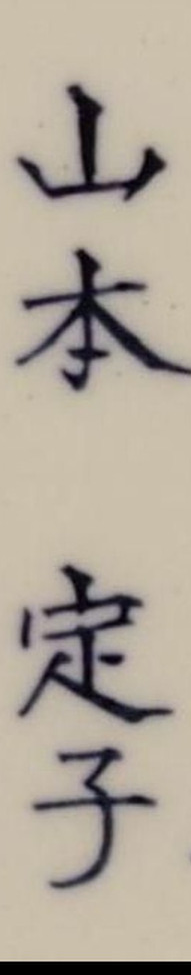山本定子
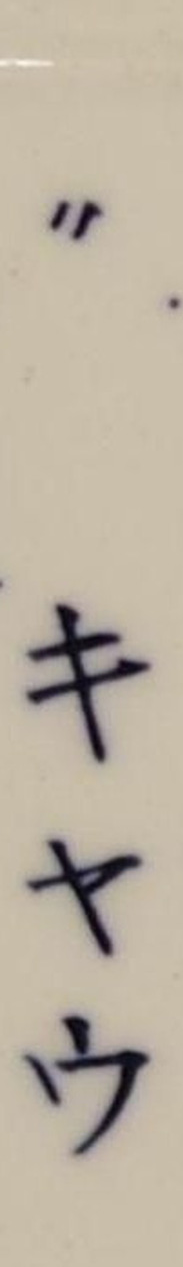キヤウ
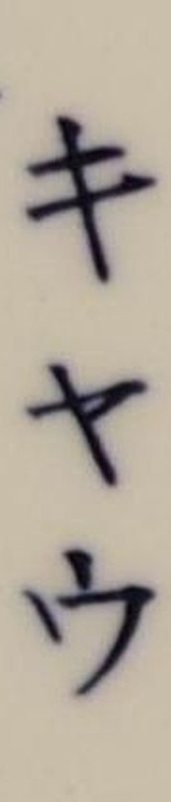キヤウ
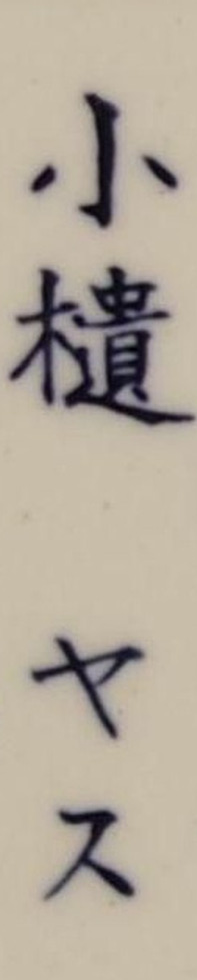小𣟧ヤス
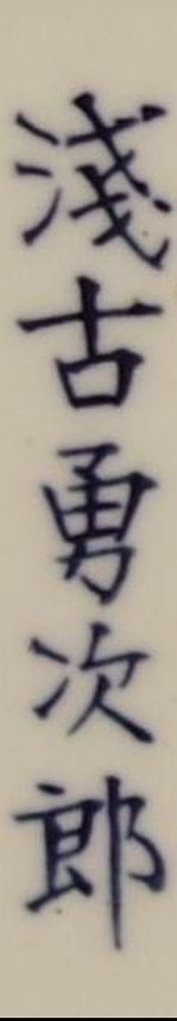浅古勇次郎
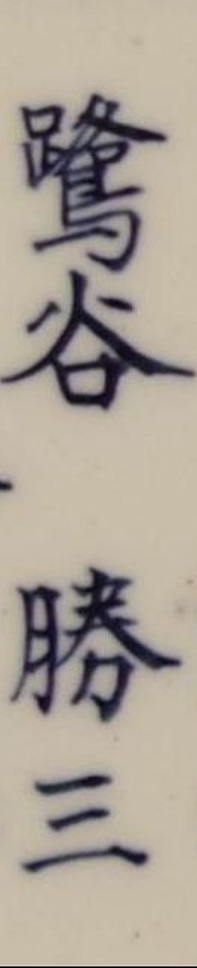鶯谷勝三
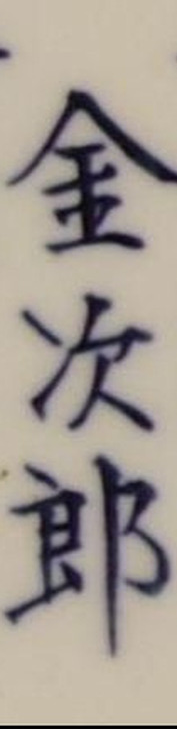金次郎
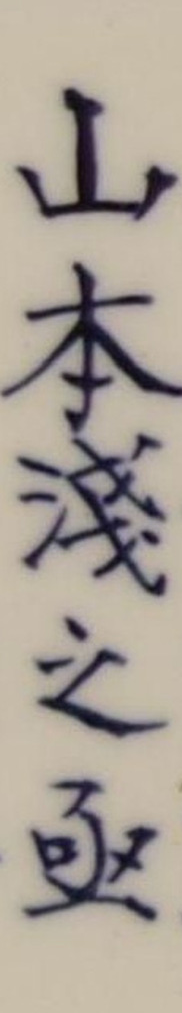山本浅之丞

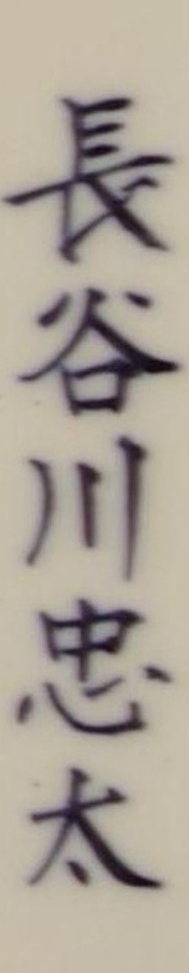長谷川忠太
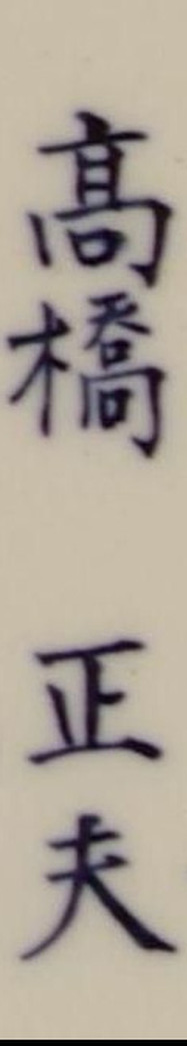高橋正夫
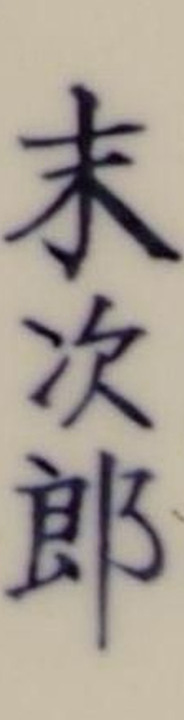末次郎
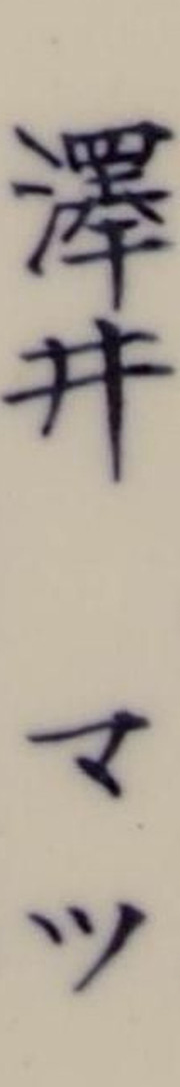澤井マツ
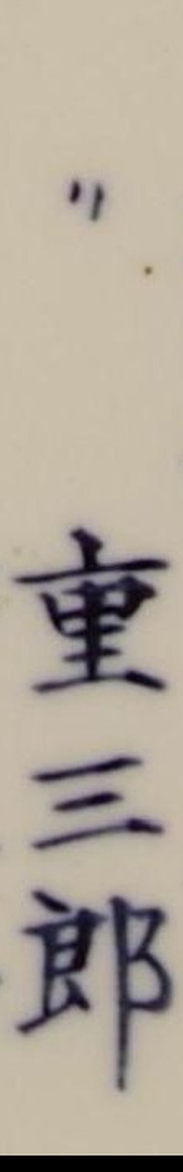重三郎
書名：E~L
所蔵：高野山金剛峯寺
